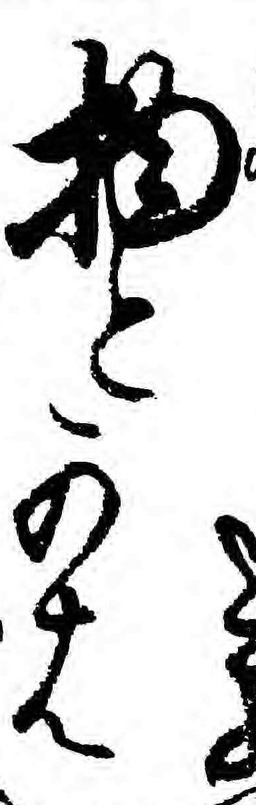物とかは
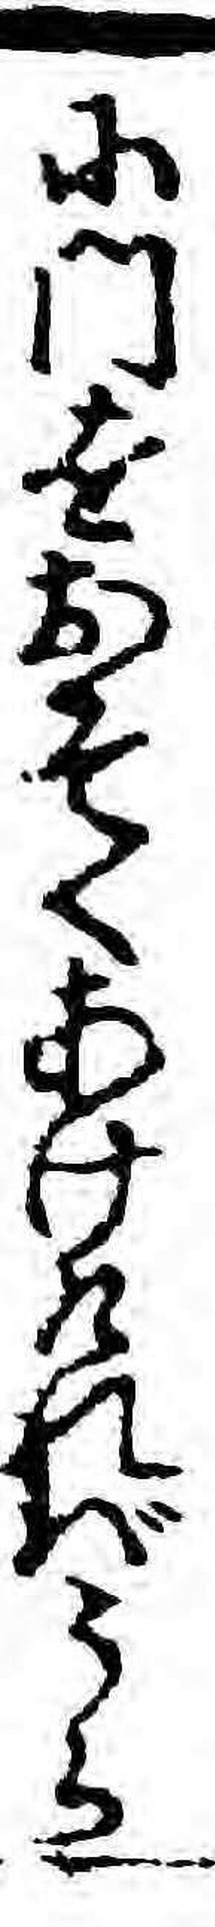に門をおそくあけければうら
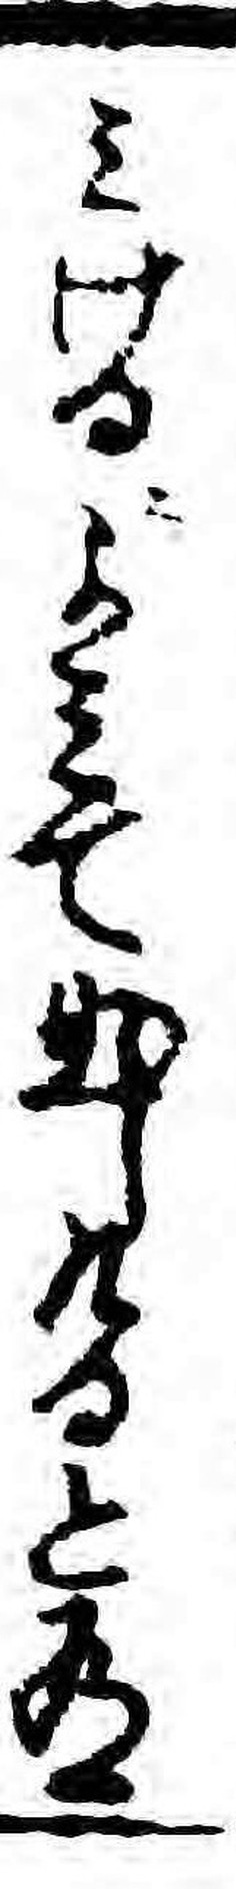みけるによみて出しけると有

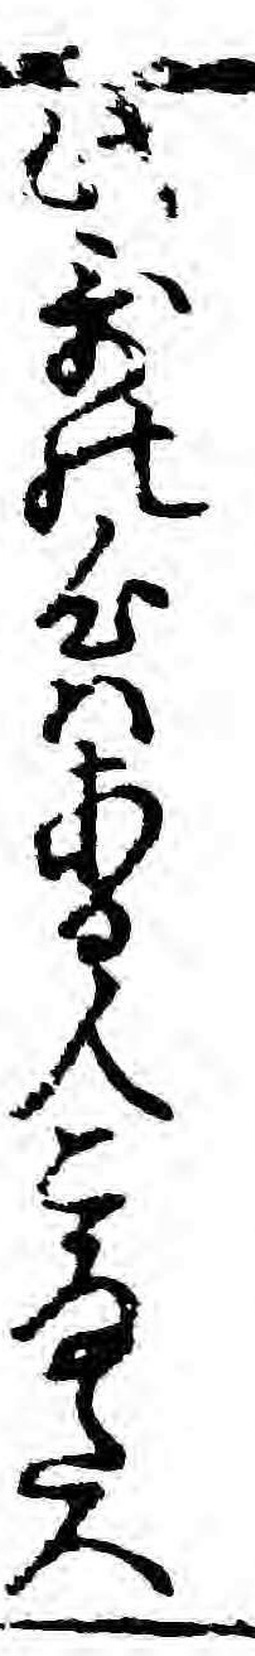此哥の心はある人こなたへ
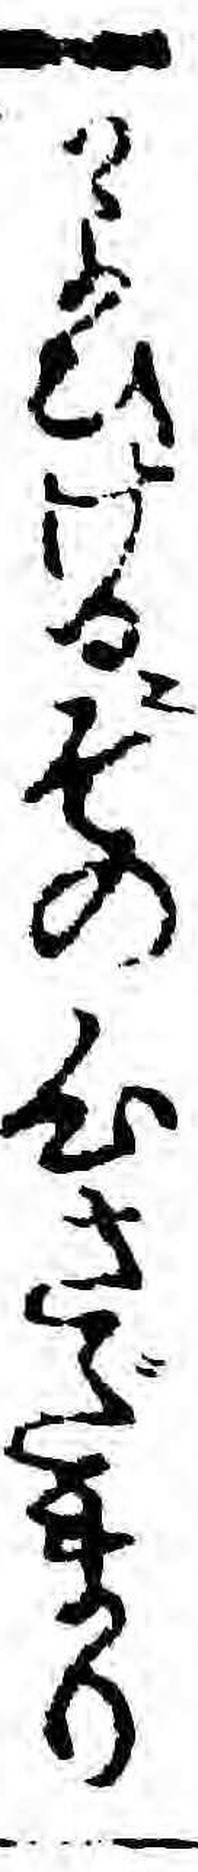かよひけるにその心さだまり
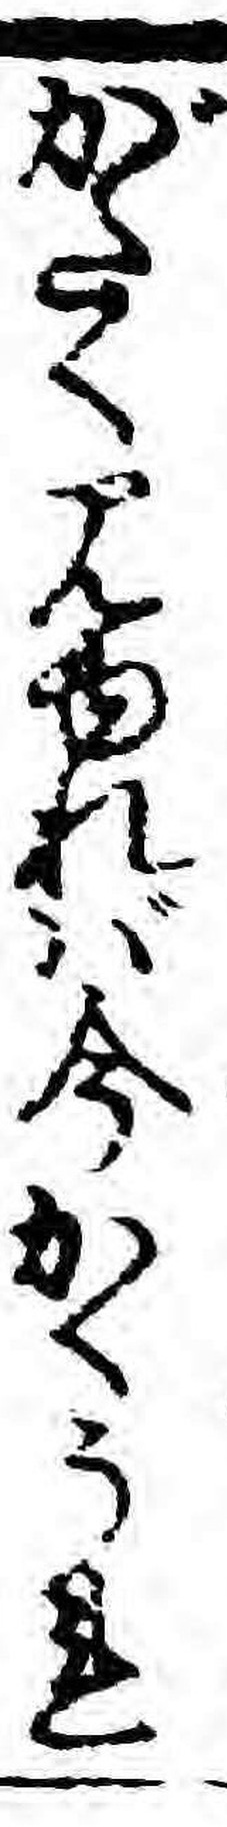がたく見ゆれば今かくうれ
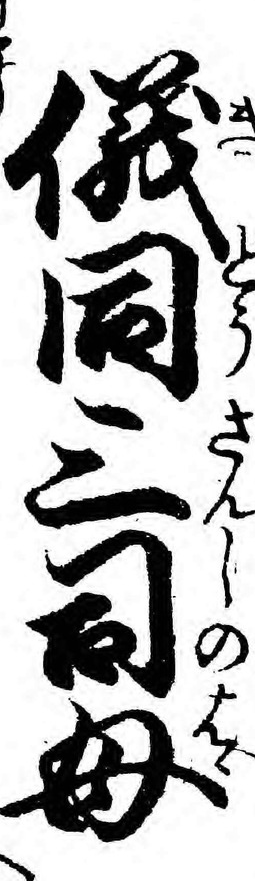儀同三司母
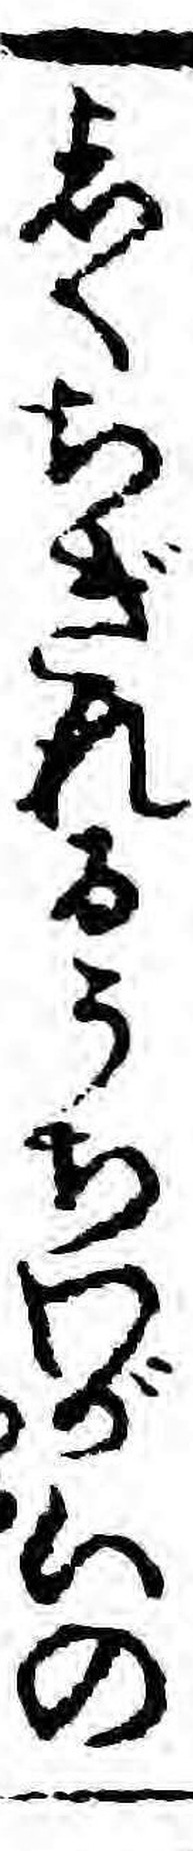しくちぎれるうちわがいの
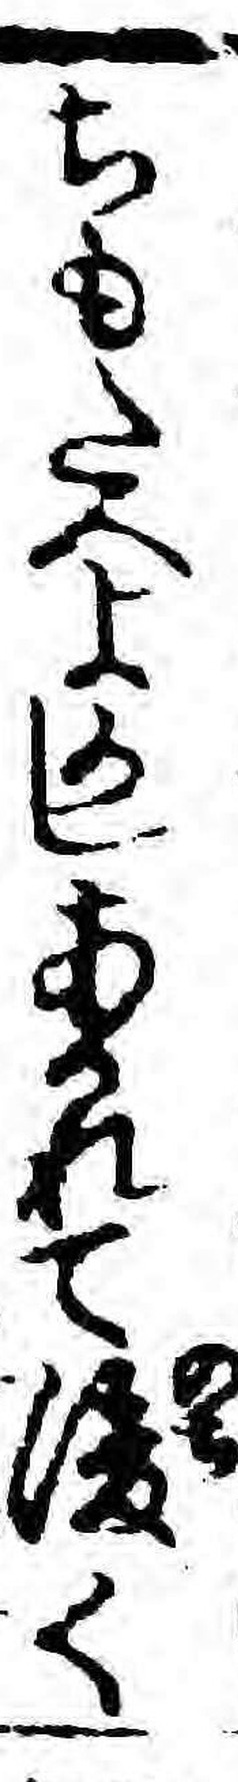ちもたへよかしあかれて後く
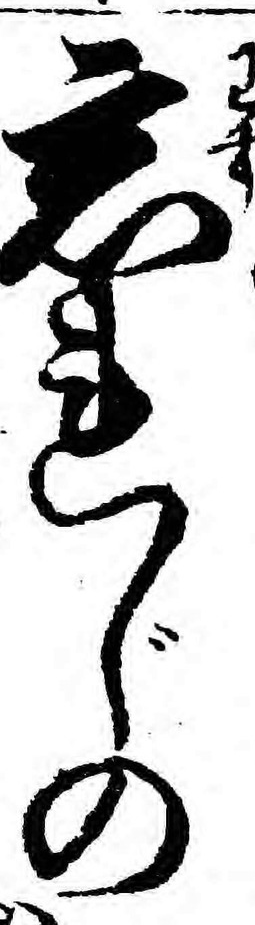忘れじの
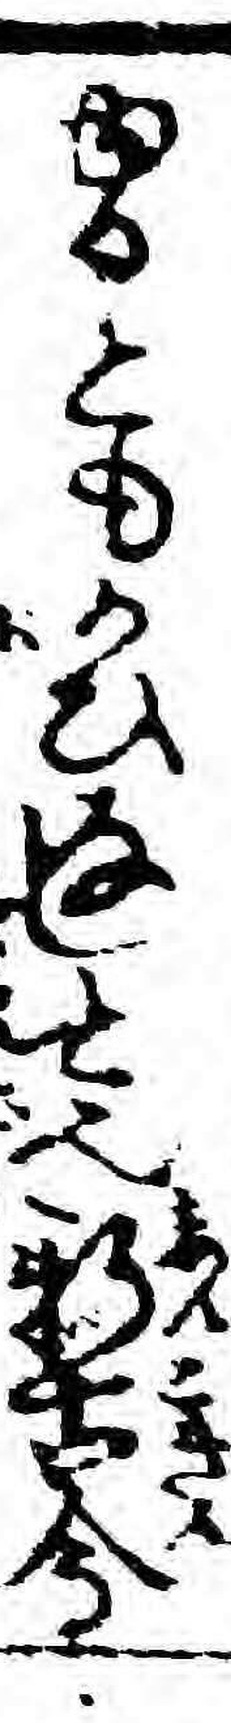ゆるともかひなしと也新古今
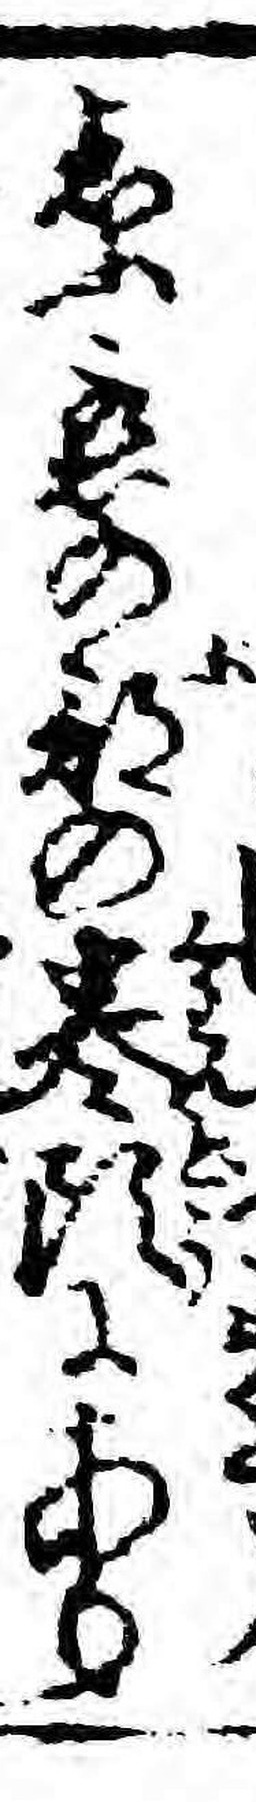しふ恋の部の巻頭にあり
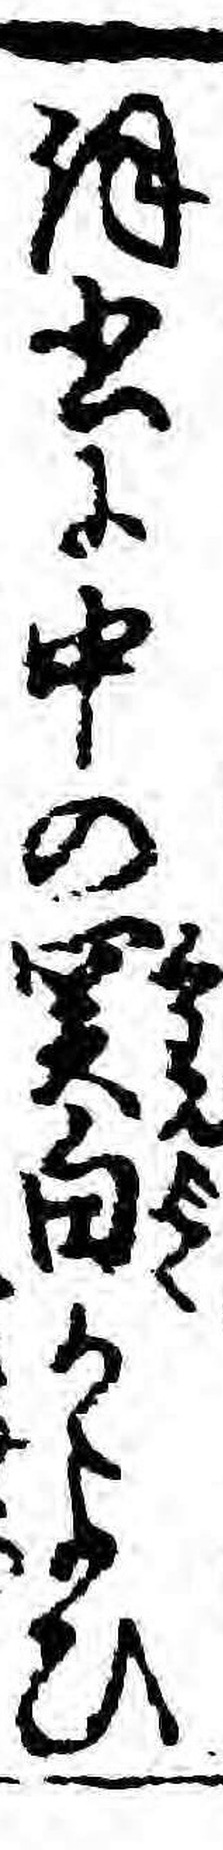詞書に中の関白かよひ
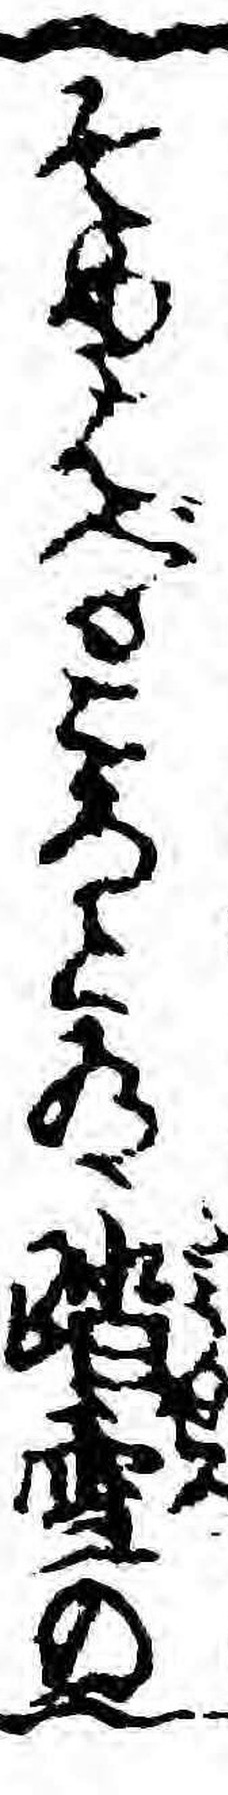そめはべるころと有踏雪の
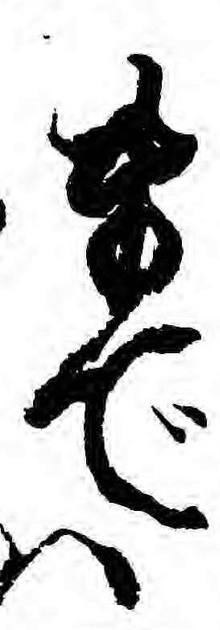までは
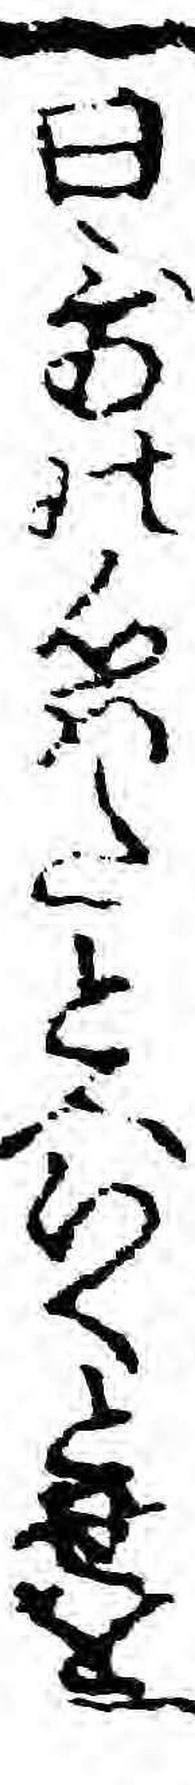曰哥の心はたとへいくとせを
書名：頭書和歌注譯／壽賀多百人一首小倉錦
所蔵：国文学研究資料館
